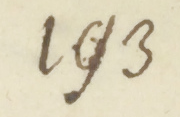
193
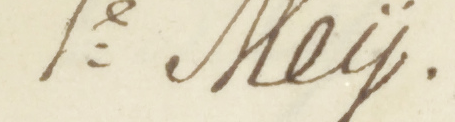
1e Meij.
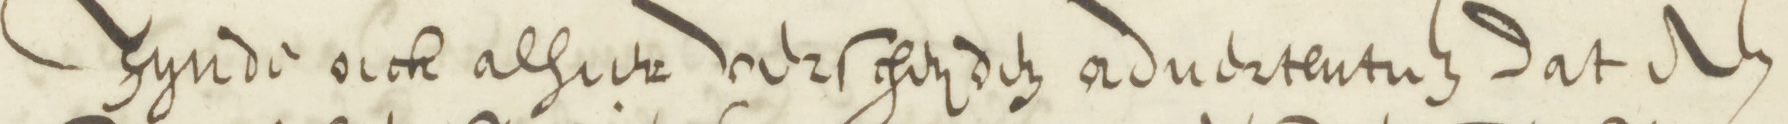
zynde oick alhier verscheyden aduertentien dat den
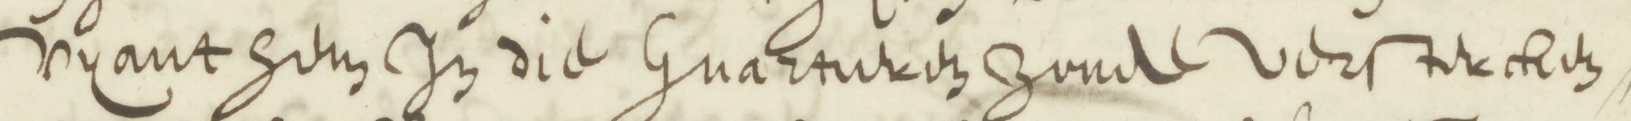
vyant hem in die quartieren zoude verstercken,
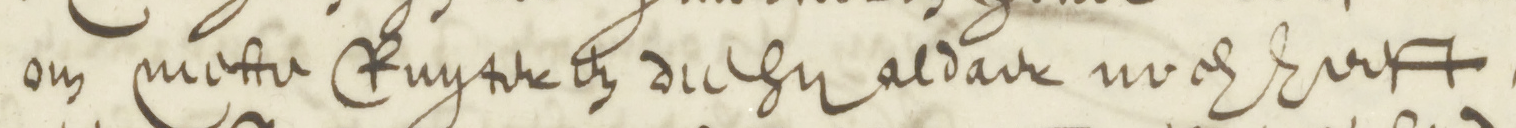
om mette Ruyteren die hy aldaer noch heeft,
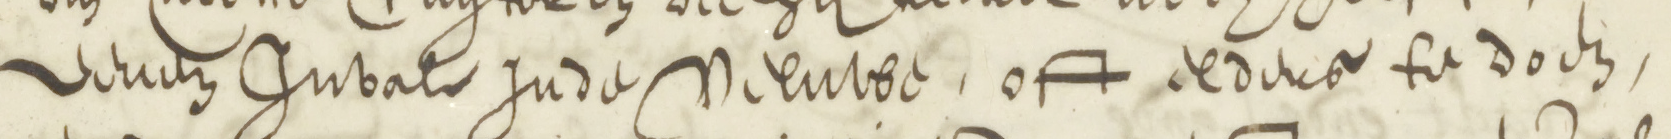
eenen Inval inde Veluwe, off elders te doen,
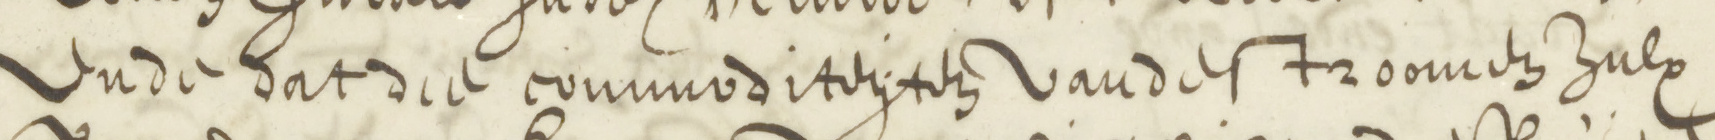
ende dat die commoditeijten vande stroomen zulx
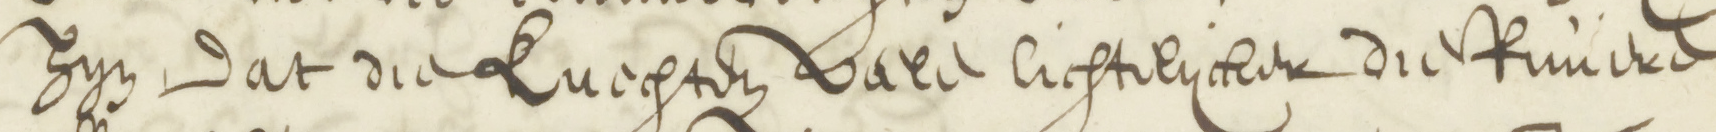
zyn, dat die Knechten vele lichtelijcker die Riuiere
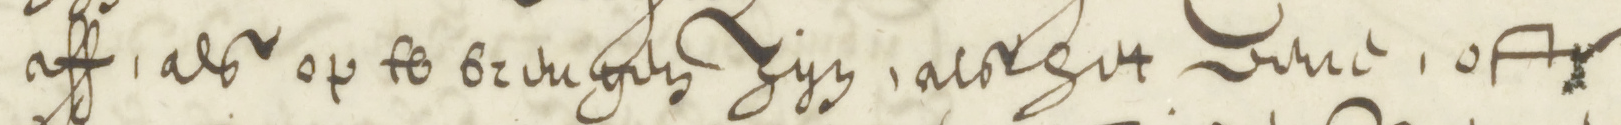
aff, als op te brengen zijn, als het eene, ofte
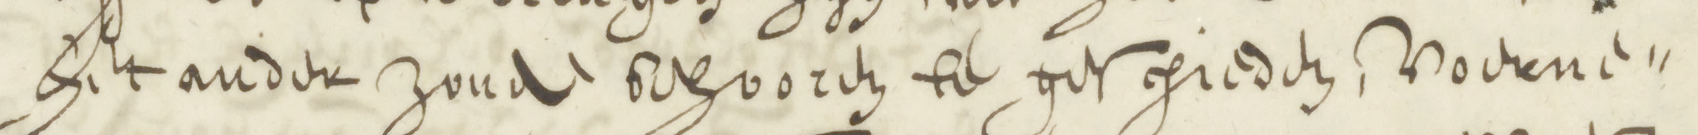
het ander zoude behooren te geschieden, voerne„
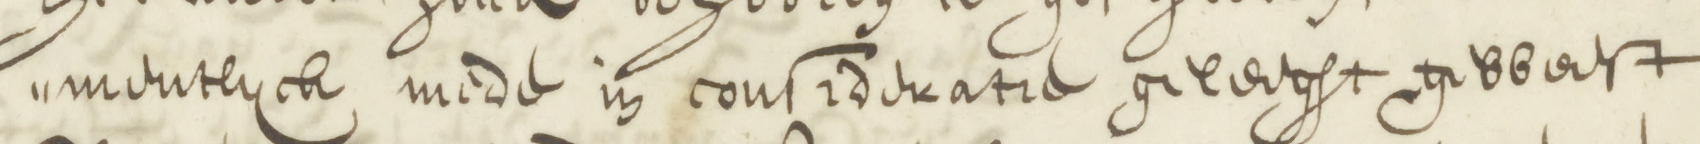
„mentlyck mede in consideratie geleeght geweest
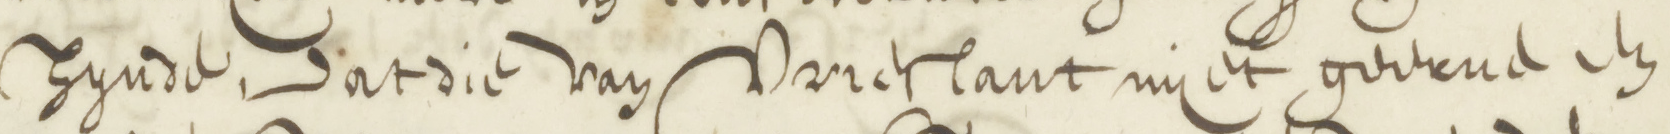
zynde, dat die van Vrieslant nijet geerne en
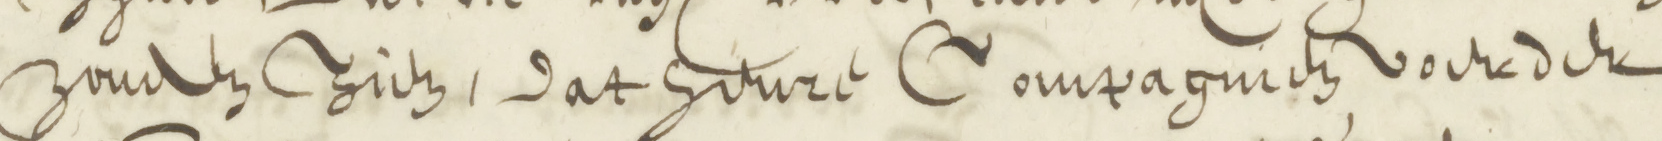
zouden zien, dat heure Compagnien voerder
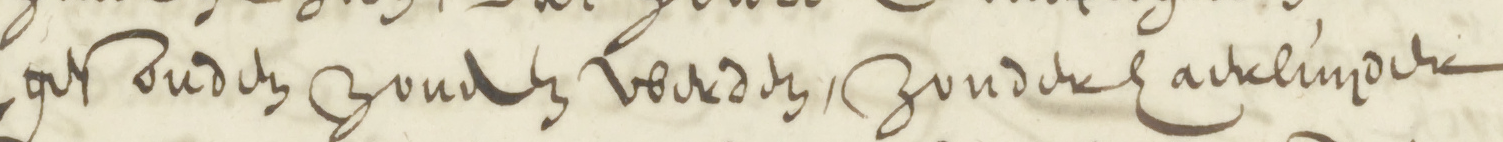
gesonden zouden werden, zonder haerluyder
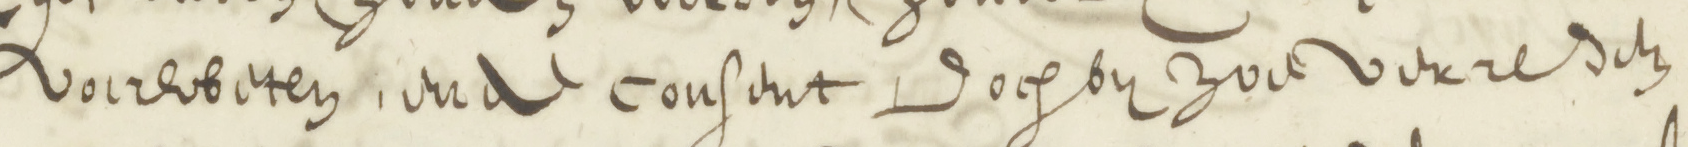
voirweten, ende consent, doch by zoeverre den
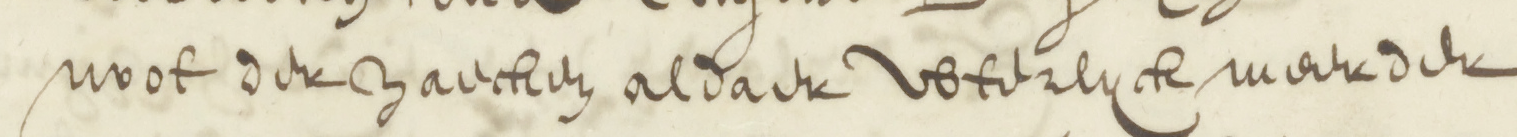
noot der zaecken aldaer wterlyck meerder
